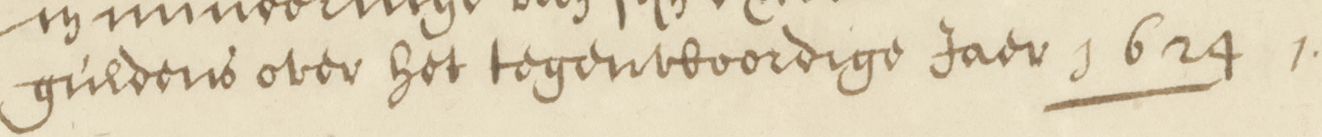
guldens over het tegenwoordige Jaer 1624.
